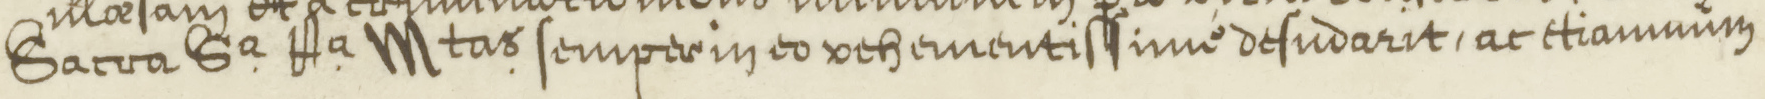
Sacra Sa. Ra. Mtas. semper in eo vehementissime desudarit, ac etiamnum
